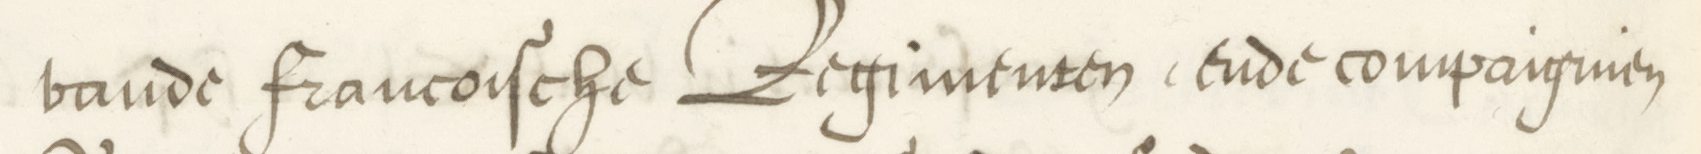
vande Francoische Regimenten, ende compaignien
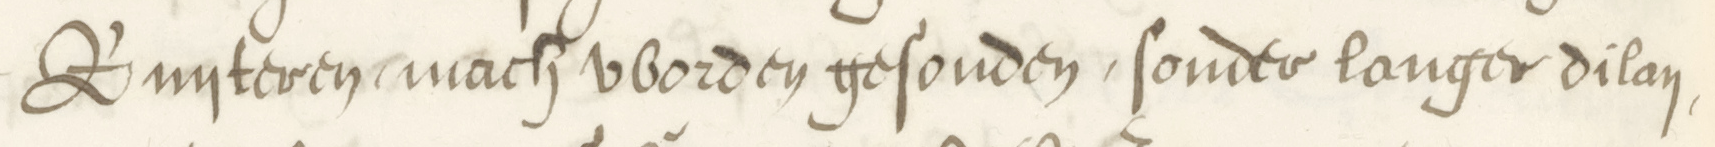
Ruyteren mach worden gesonden, sonder langer dilay,
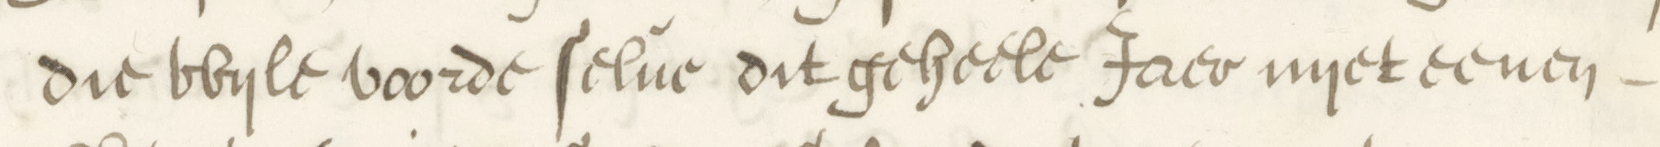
die wyle voorde selue dit geheele Jaer nyet eenen
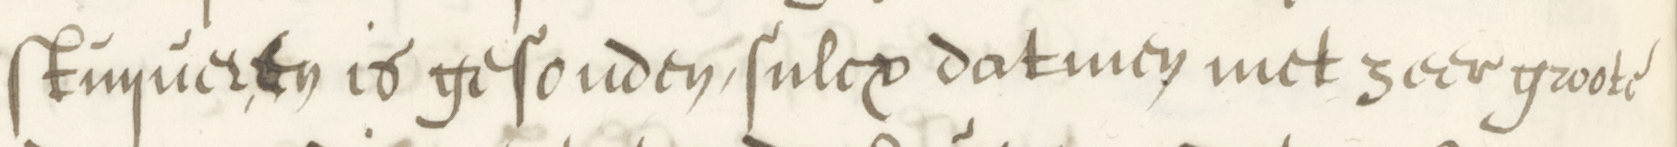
stuyueren is gesonden, sulcx datmen met zeer groote
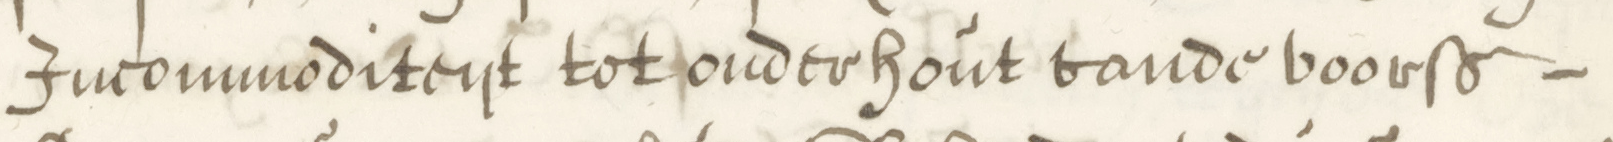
Incommoditeyt tot onderhout vande voors -
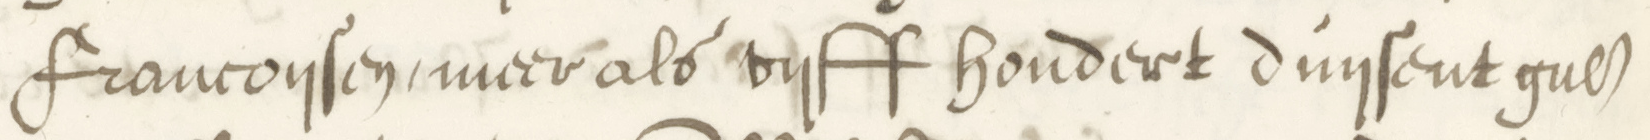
Francoysen meer als vyff hondert duysent gul
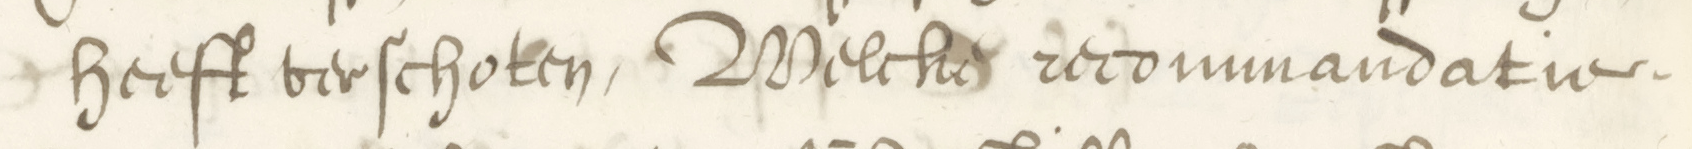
heeft verschoten. Welcke recommandatie
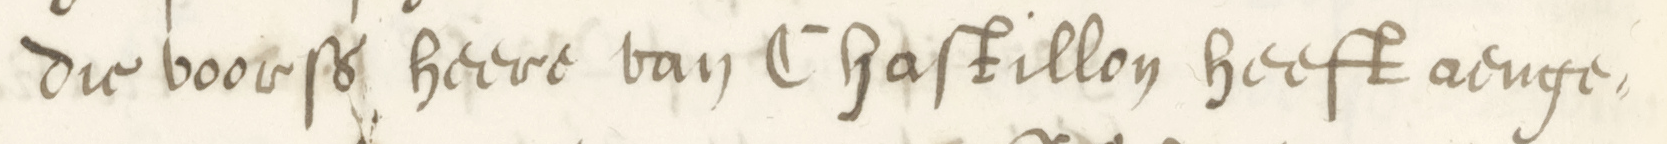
die voors heere van Chastillon heeft aenge„
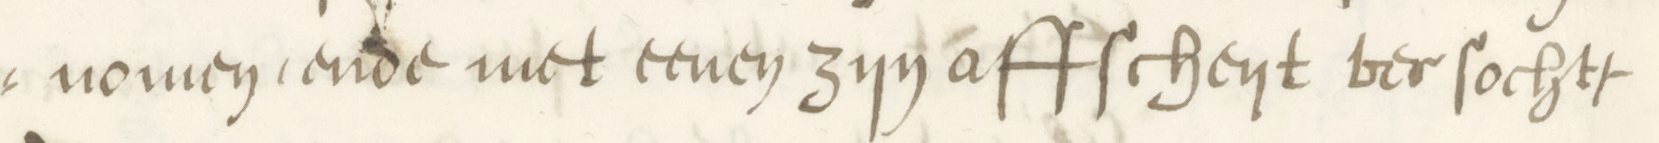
nomen ende met eenen zyn affscheyt versocht
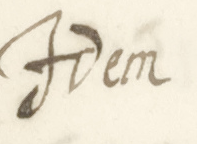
Idem
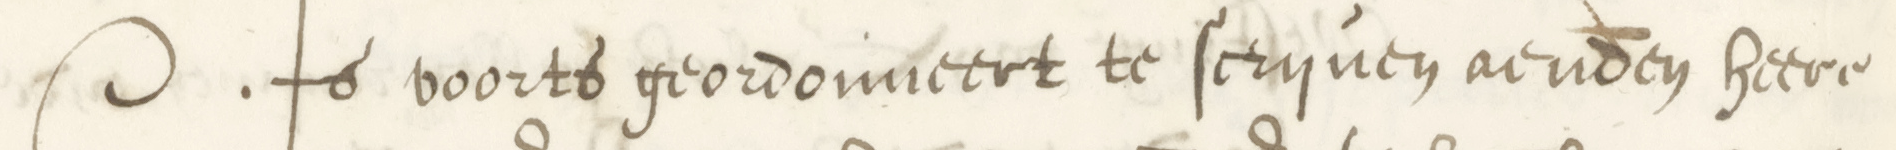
Is voorts geordonneert te scryuen aenden heere
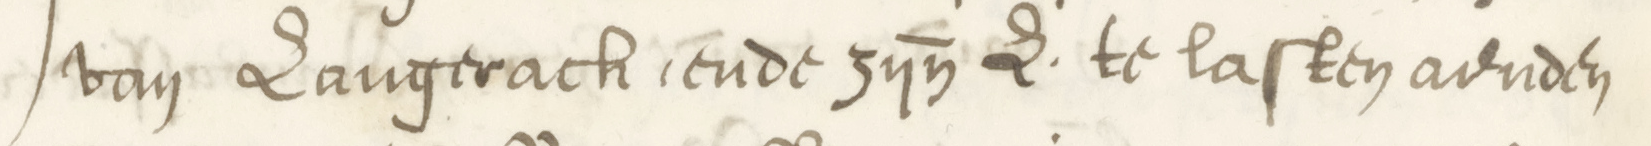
van Langerack ende zyn L. te lasten aenden
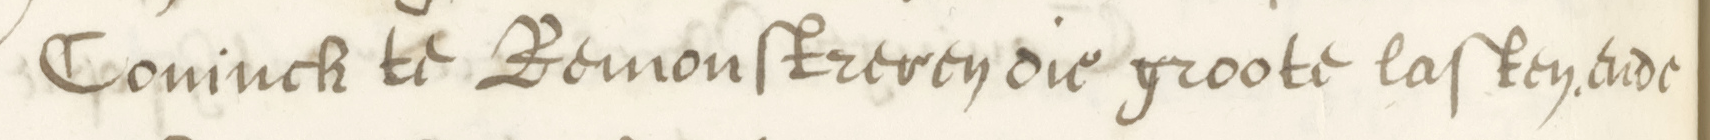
Coninck te Remonstreren die groote lasten ende
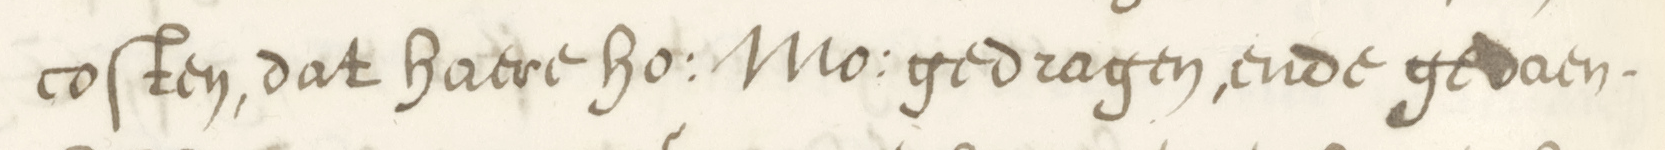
costen, dat haere Ho:Mo: gedragen, ende gedaen
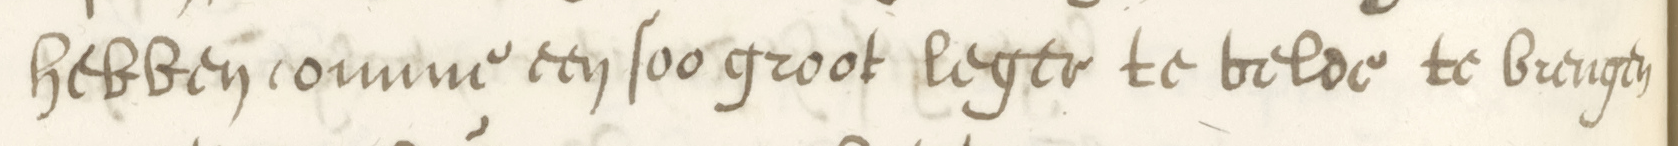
hebben omme een soo groot leger te velde te brengen
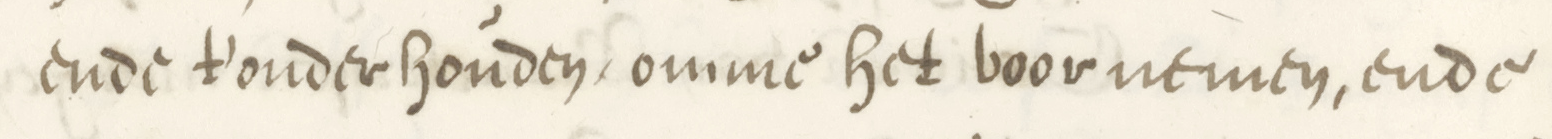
ende t'onderhouden, omme het voornemen, ende
